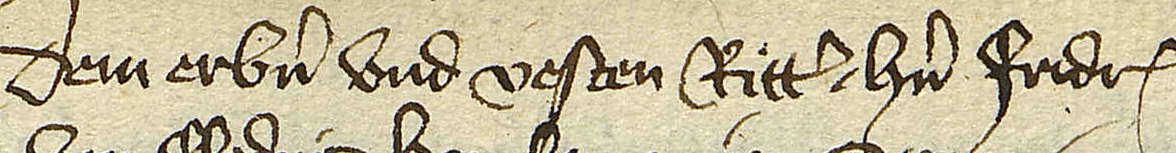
Dem erbn* vnd veſten Ritt* / hn* Fridr*
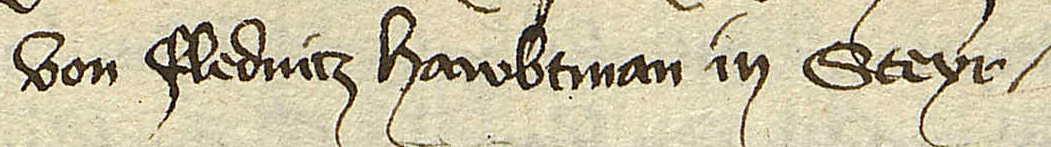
von Flednicʒ hawbtman in Steyr /
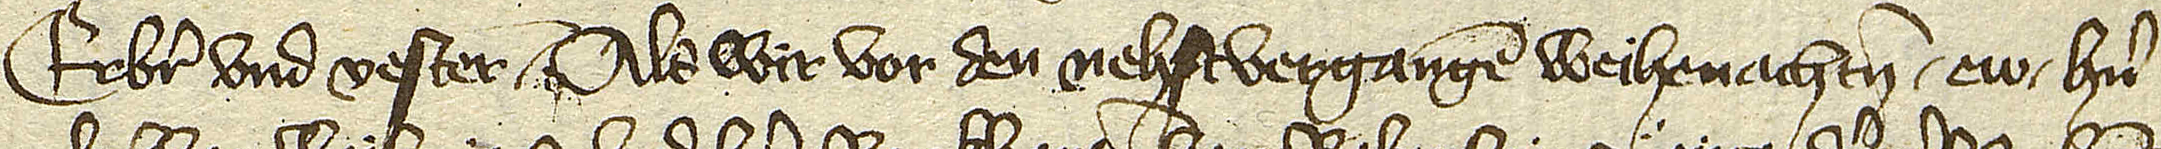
Erbr* vnd veſter / Als wir vor den nehſtvergange* weihenachtn* / ew / hn*
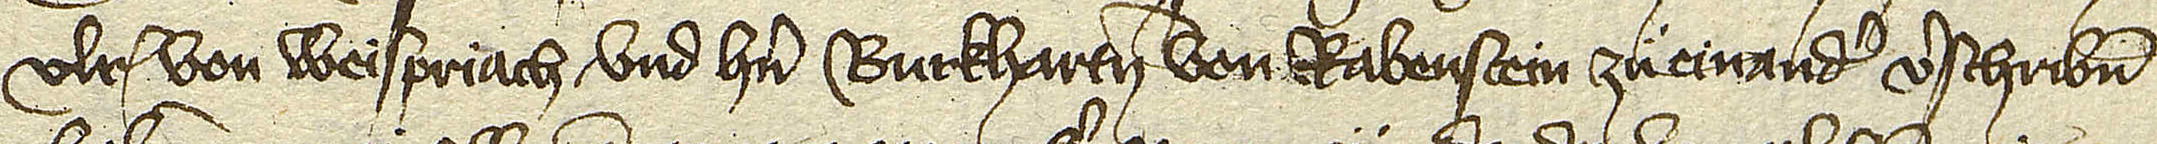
vlr* von weiſpriach / vnd hn* Burkhartn* von Rabenſtein cʒü einand* v*ſchribn*
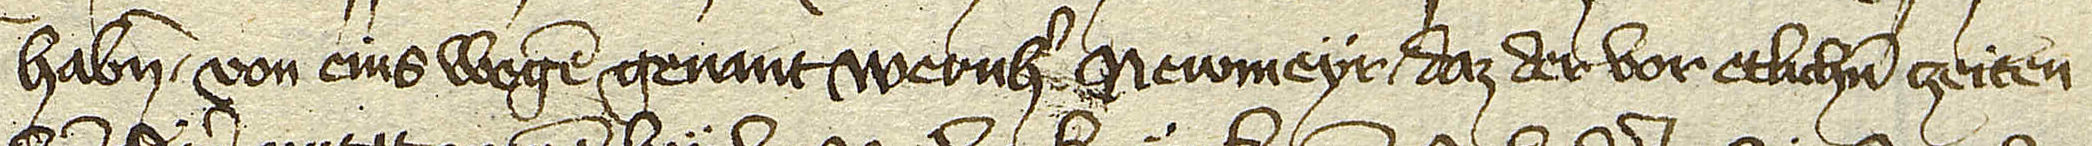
habn* / von eins wege* genant Wernh* Newmeyr / daʒ der vor etlichn* cʒeiten
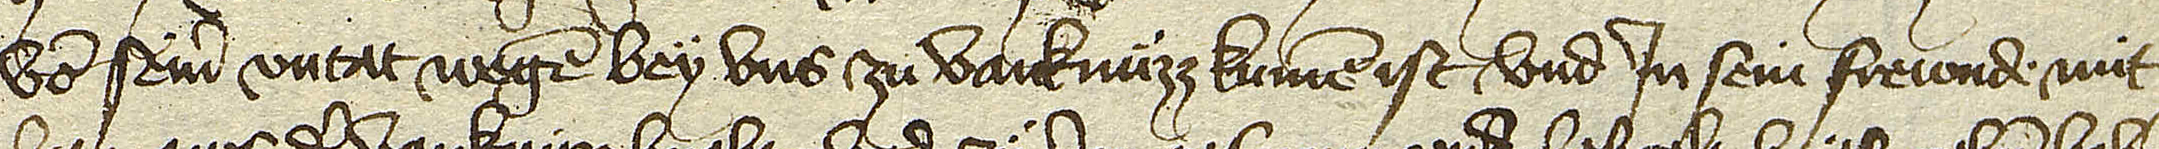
vo* ſein* vntat wege* bey vns cʒu vanknüʒʒ kume* iſt / vnd In ſein frewnde mit
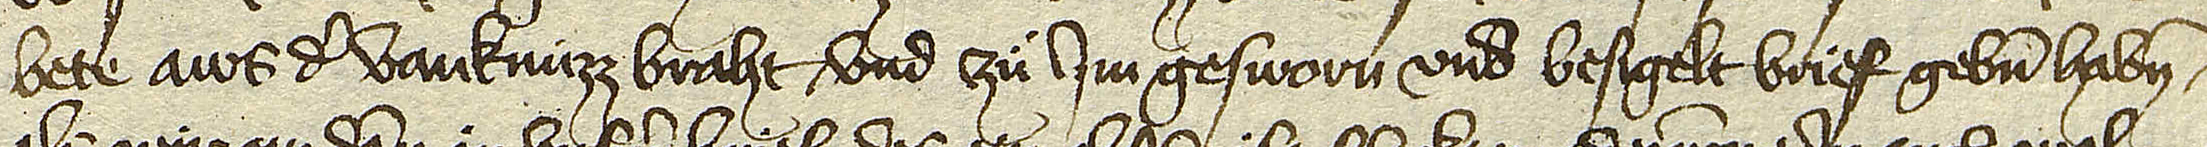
bete aws d* vanknüʒʒ braht / vnd cʒü Im geſworn vnd beſigelt brief gebn* habn* /
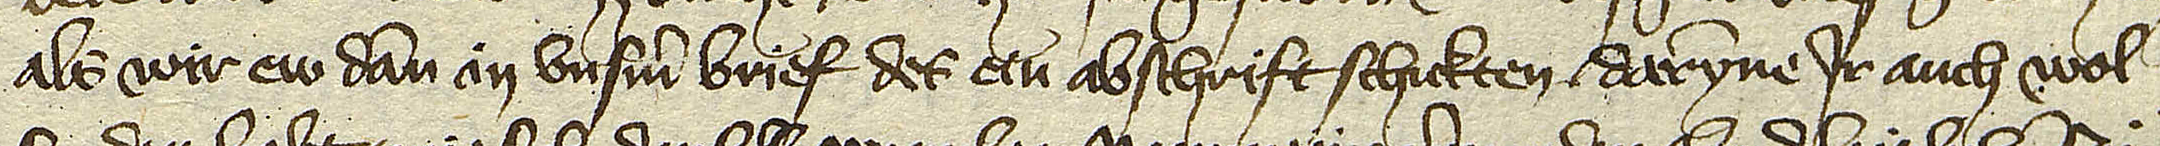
als wir ew dan* in vnſm* brief des ein abſchrift ſchickten / dary*ne Ir auch wol
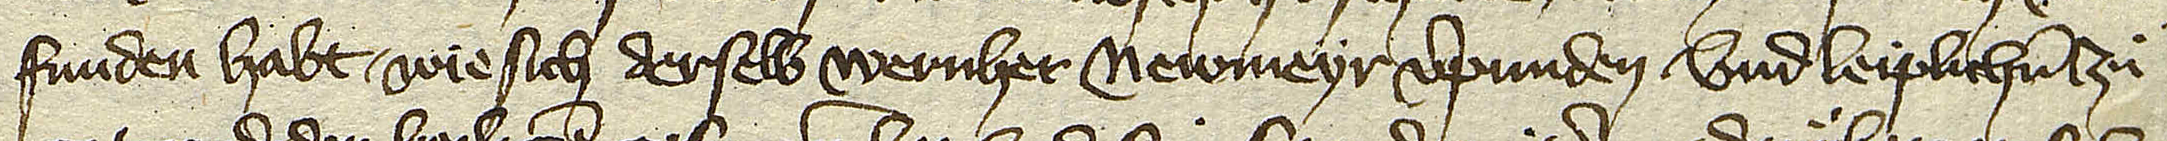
funden habt / wie ſich derſelb Wernher Newmeyr v*punden / vnd leiplichn* cʒü
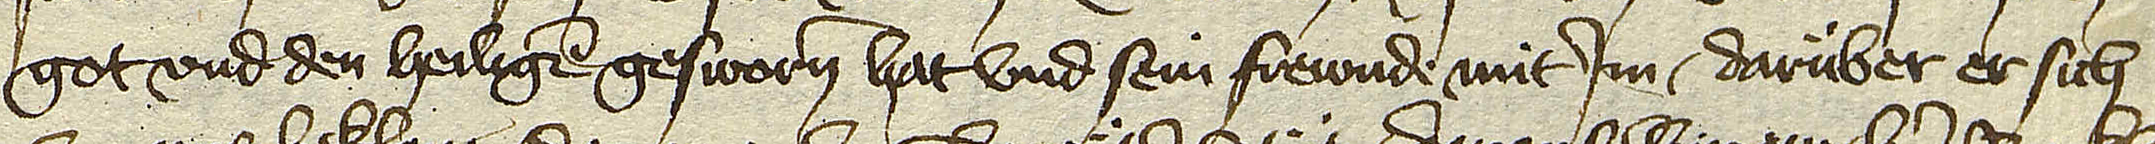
got vnd den heilige* geſworn* hat vnd ſein frewnde mit Im / darüber er ſich
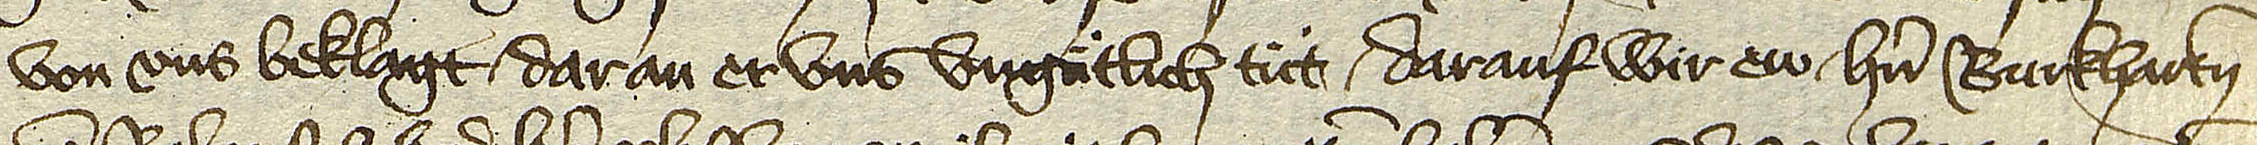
von vns beklagt / daran er vns vngütlich tüt / darauf wir ew / Hn* Burkhartn*
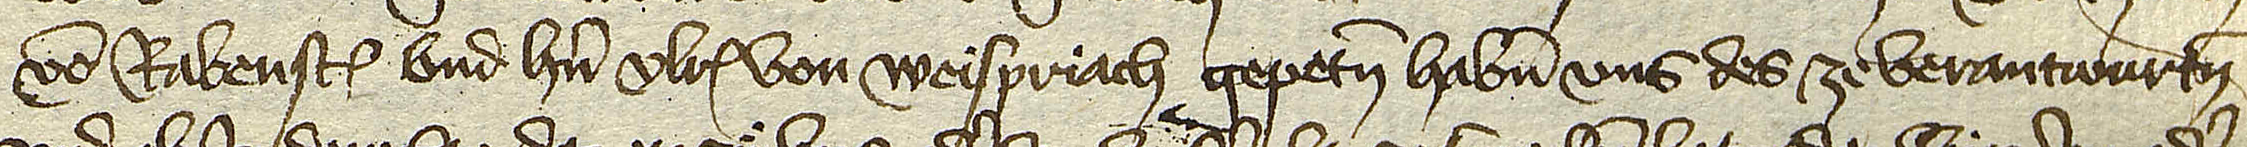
vo* Rabenſt* vnd hn* vlr* von weiſpriach gepetn* habn* vns des cʒe verantwurtn*
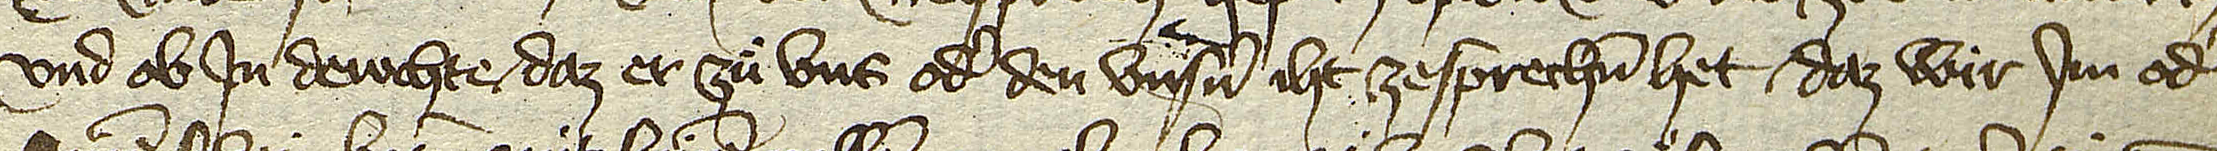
vnd ob In dewchte / daʒ er cʒü vns od* den vnſn* iht cʒeſprechn* het / daʒ wir Im od*
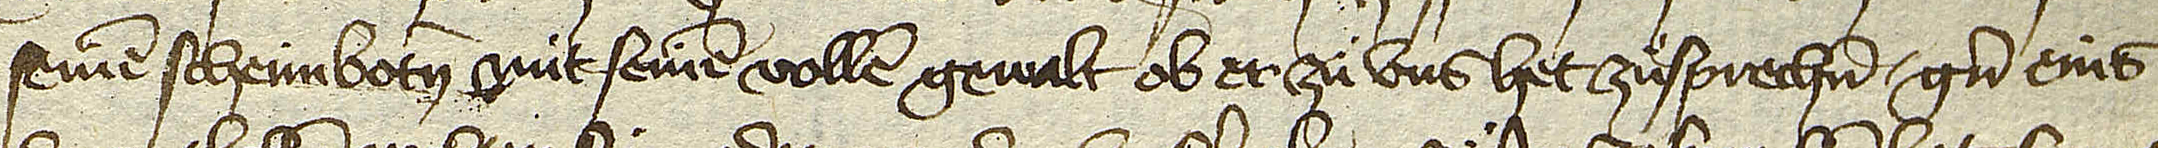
ſeine* ſcheimbotn* mit ſeine* volle* gewalt ob er cʒü vns het cʒüſprechn* / gn* eins
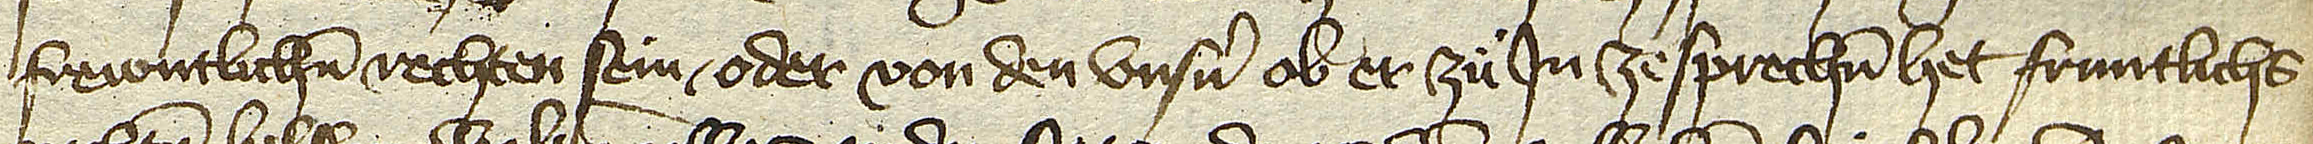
frewntlichn* rechten ſein / oder von den vnſn* ob er cʒü In cʒeſprechn* het fruntlichs
